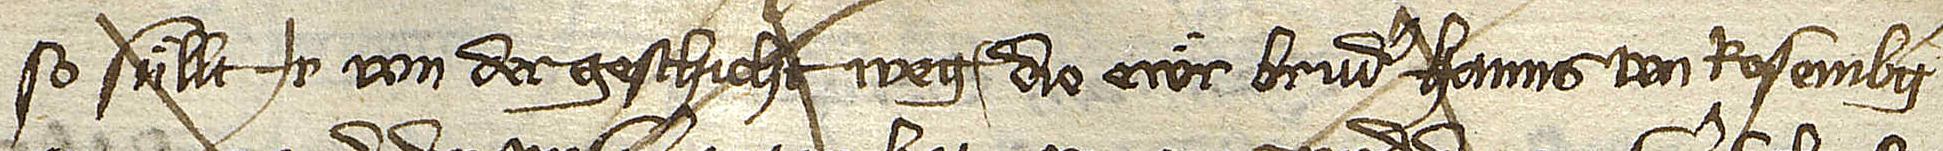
ſo ſüllt Ir von der geſchicht weg* die ewr brud* hanns von Roſemb*g
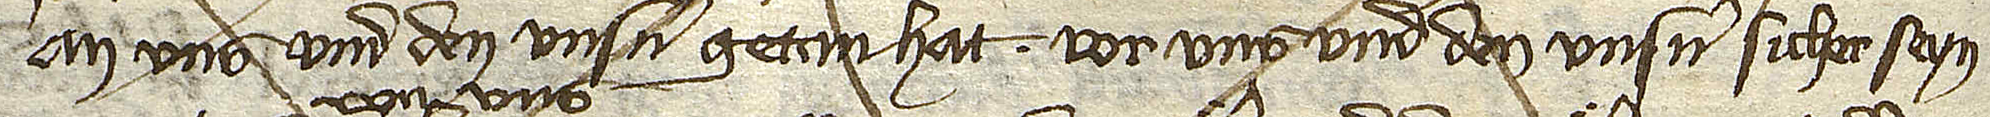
an vns vnd den vnſ*n getan hat . vor vns vnd den vnſ*n ſicher ſeyn
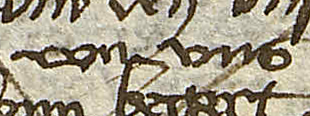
von vns
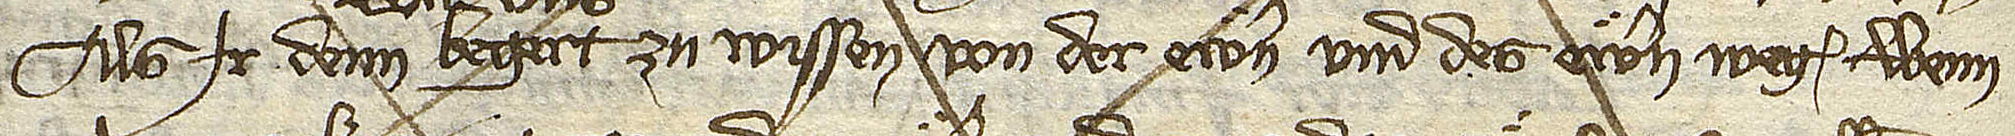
Als Ir denn begert ʒu wiſſen von der ew*n vnd des ew*n weg* / Wenn
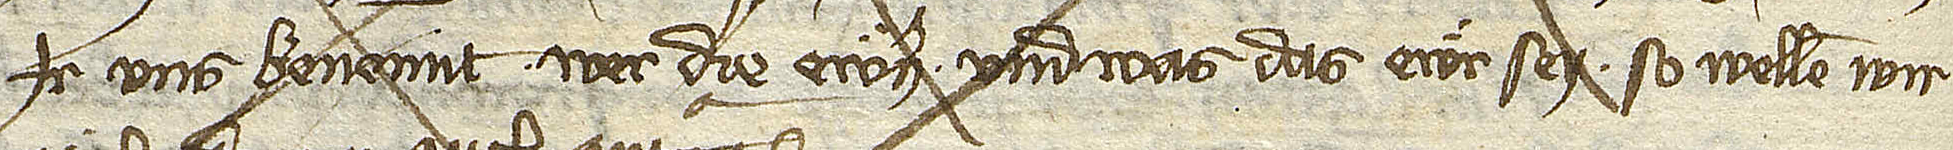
Ir vns benennt . wer die ew*n . vnd was das ewr ſey . ſo welle* wir
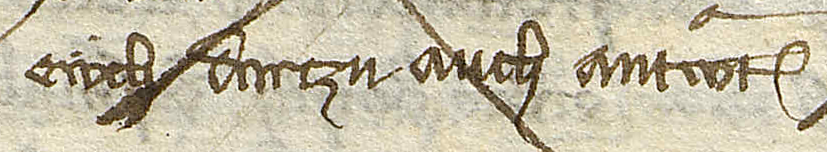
ewch darcʒu auch antw*t*
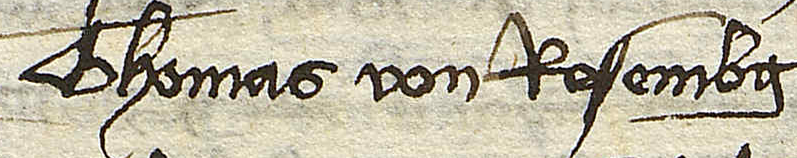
Thomas von Roſemb*g
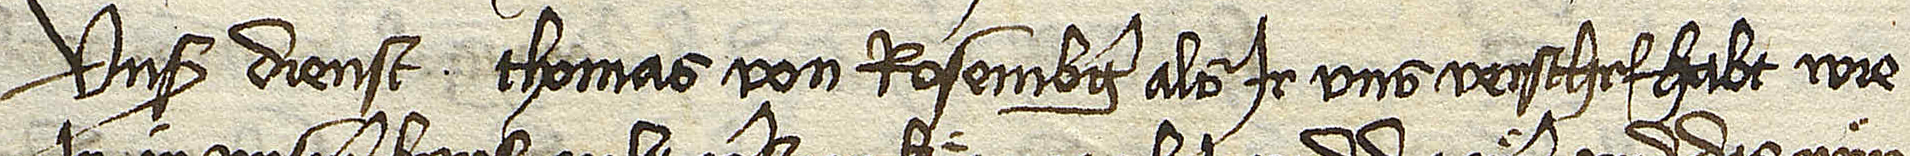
Vnſ* dienſt . thomas von Roſemb*g als Ir vns verſchr* habt wie
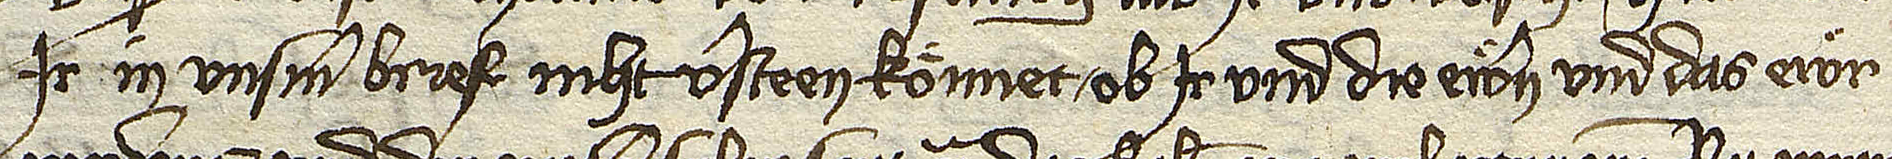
Ir in vnſ*m brief niht v*ſteen könnet / ob Ir vnd die ew*n vnd das ewr
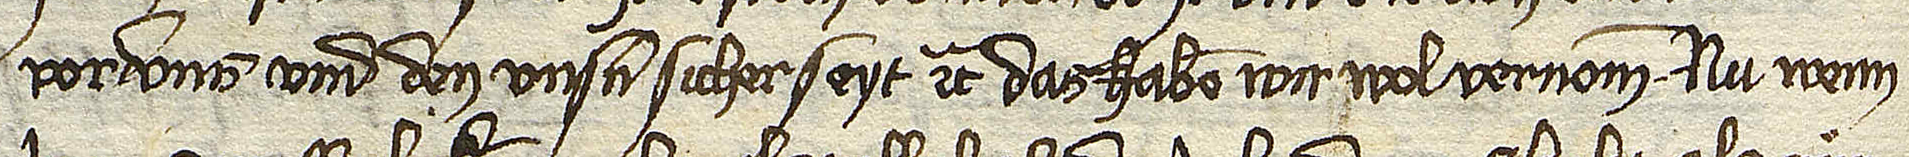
vor / Vns vnd den vnſ*n ſicher ſeyt ec* das habe* wir wol vernom* . Nu wenn
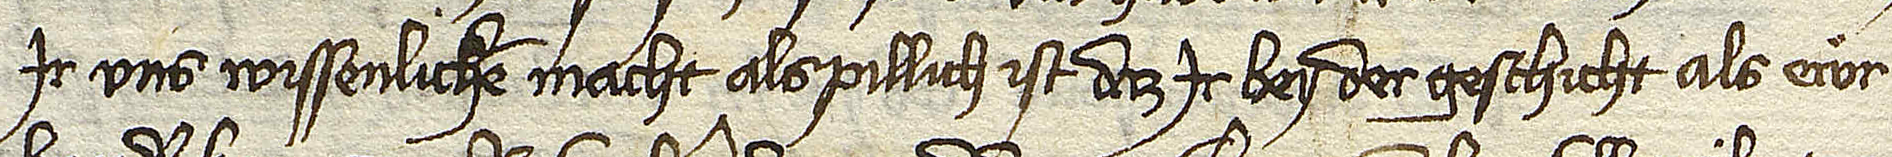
Ir vns wiſſenliche* macht als pillich iſt daʒ Ir bey der geſchicht als ewr
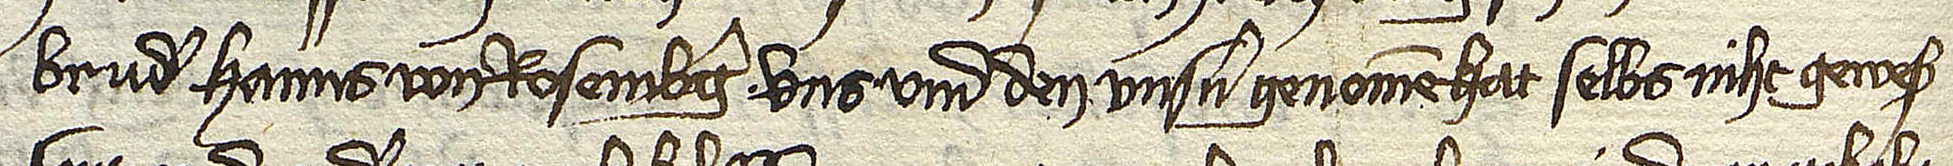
brud* Hanns von Roſemb*g . Vns vnd den vnſ*n genome* hat ſelbs niht geweſ*
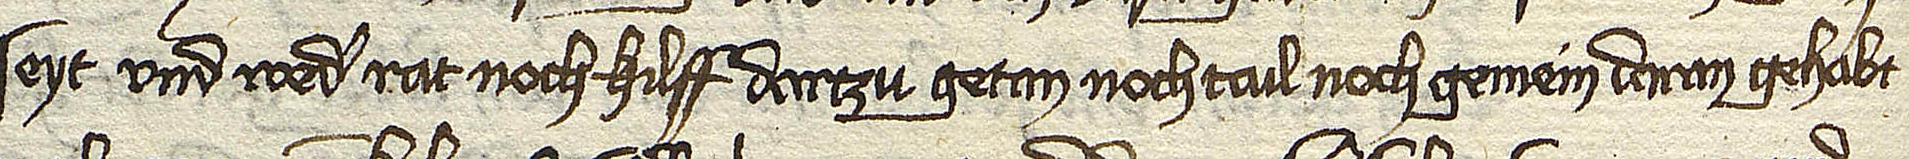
ſeyt vnd wed* rat noch hilff darcʒu getan noch tail noch gemein daran gehabt
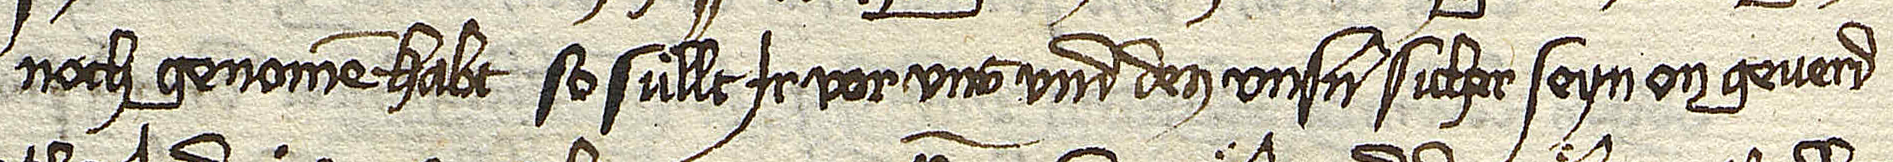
noch genome* habt ſo ſüllt Ir vor vns vnd den vnſ*n ſicher ſeyn on geuerd
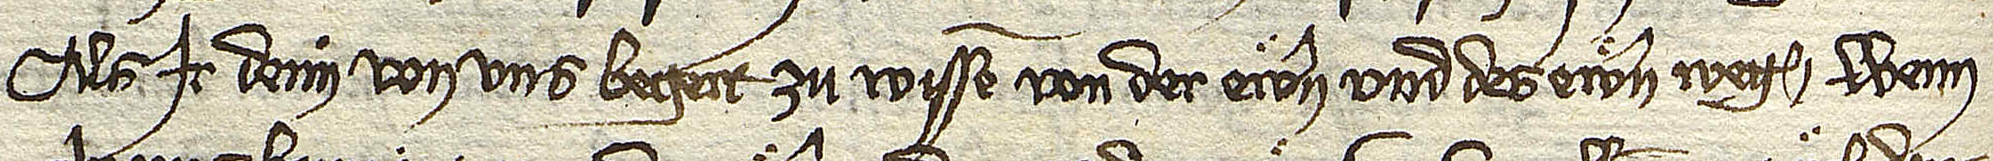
Als Ir denn von vns begert ʒu wiſſe* von der ew*n vnd des ew*n weg* / Wenn
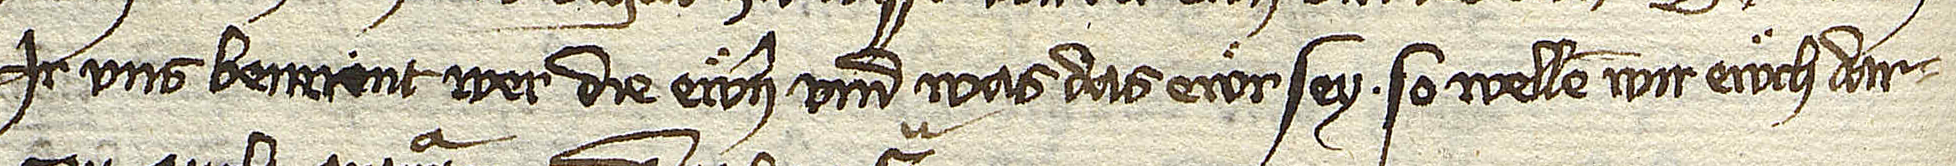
Ir vns benennt wer die ew*n vnd was das ewr ſey . ſo welle* wir ewch dar =
